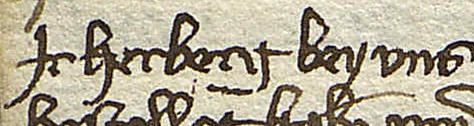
Ir herberg bey vns
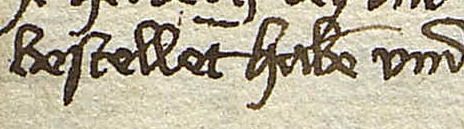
beſtellet habe* vnd
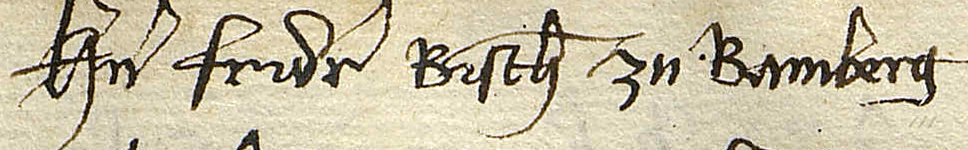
H*n Fridr* Biſch* ʒu Bamberg
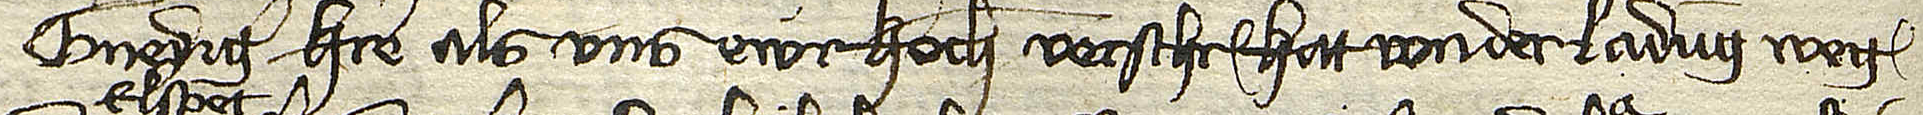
Gnedig* h*re als vns ewr Hoch* verſchr* hat von der ladu*g weg*
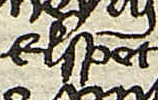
Elſpet
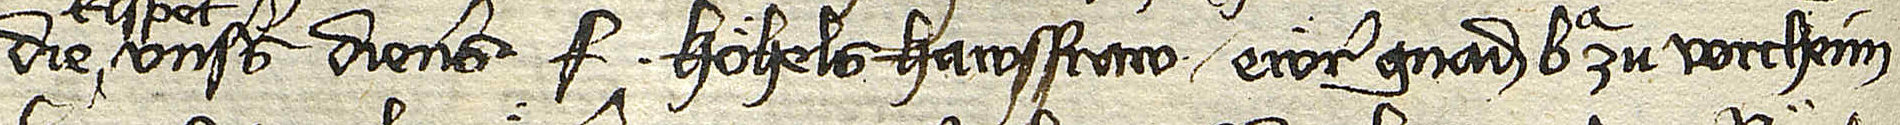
die vnſ*s dien*s F . höhels hawſfraw / ew*r gnad* b* ʒu vorcheim
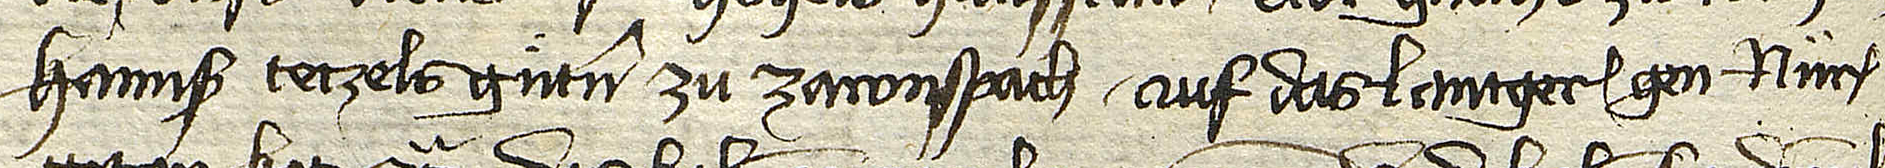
hannſ* tecʒels güt*n ʒu ʒawnſpach / auf das lantger* gen Nür*
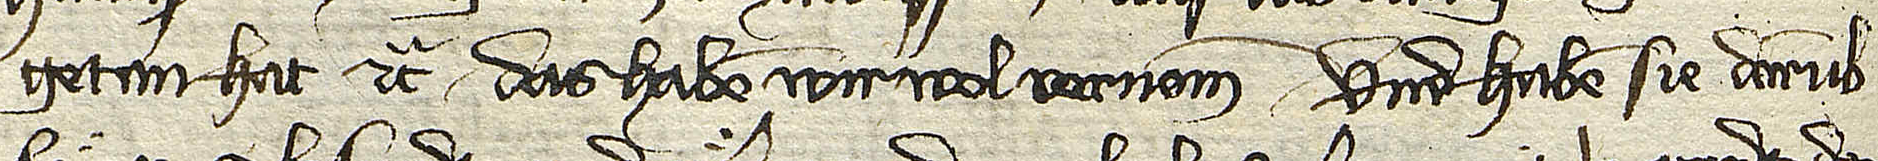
getan hat ec* / Das habe* wir wol vernom* / Vnd habe* ſie daru*b
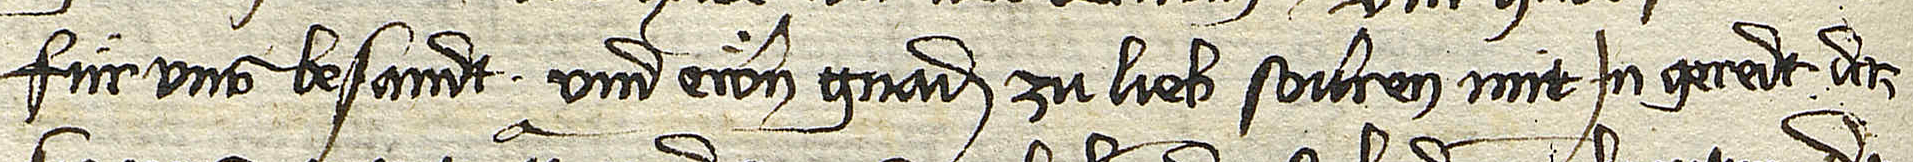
für vns beſandt . vnd ew*n gnad* ʒu lieb ſou*ren mit In geredt . daʒ
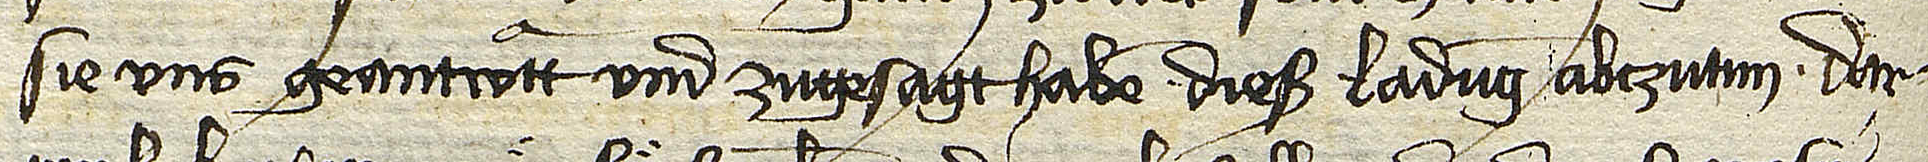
ſie vns geantw*tt vnd ʒugeſagt habe* . dieſ* ladu*g abcʒutun . Dar =
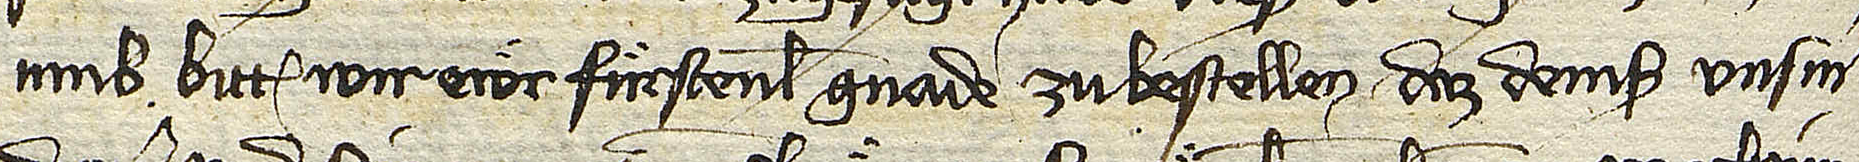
umb bitt* wir ewr fürſtenl* gnade ʒu beſtellen / daʒ demſ* vnſ*m
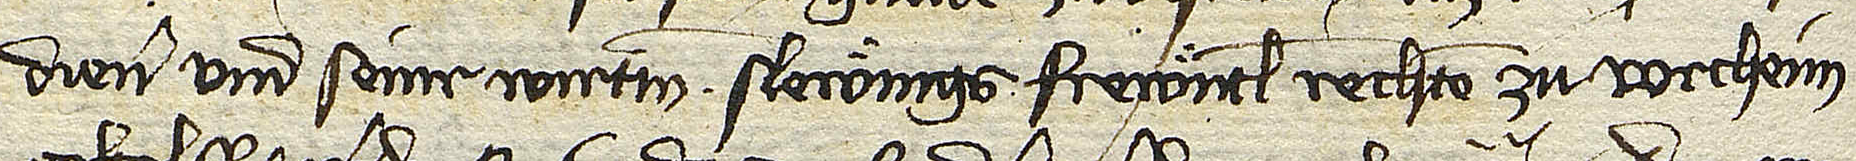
dien* vnd ſeinr wirtin* . ſlewnigs frewntl* rechte* ʒu vorcheim
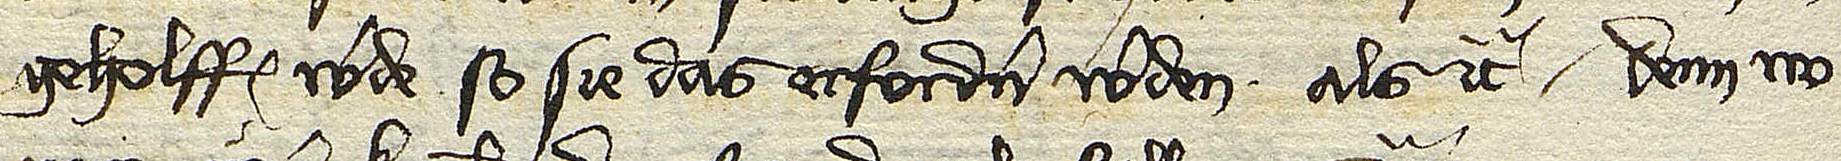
geholff* w*de ſo ſie das erford*n w*den . als ec* / Denn wo
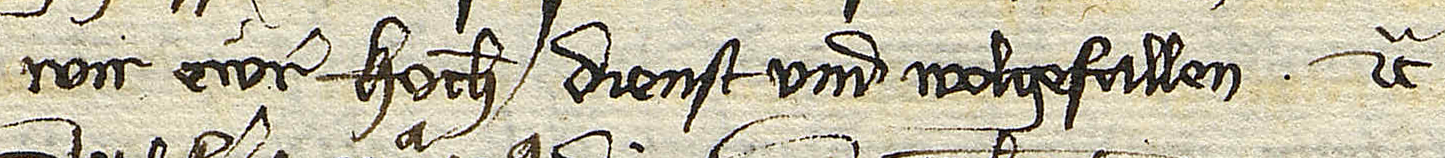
wir ew*r hoch* dienſt vnd wolfgefallen . ec*
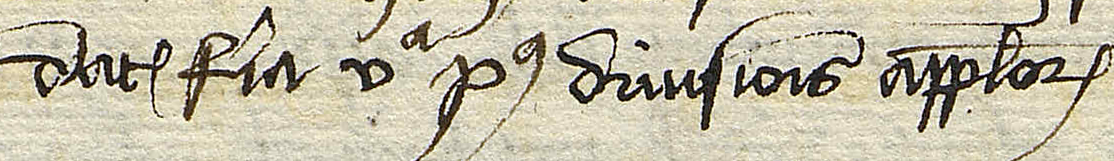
Dat* fia* v* p* diuiſio*is applo*
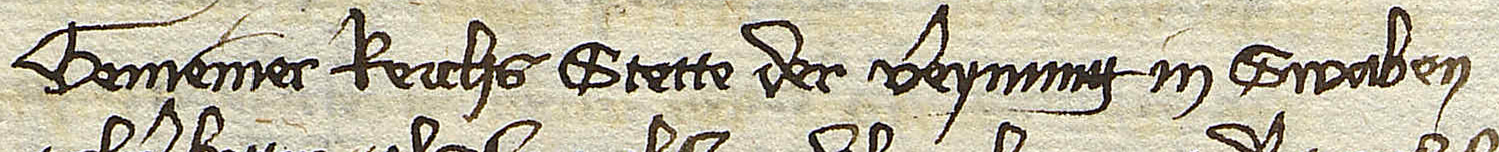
Gemeiner Reichs Stette der v*eynung in Swaben
